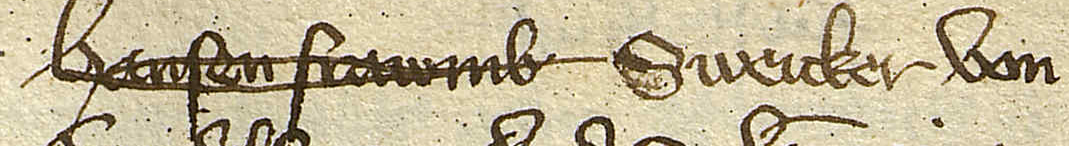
hanſen frawmb Sweicker von
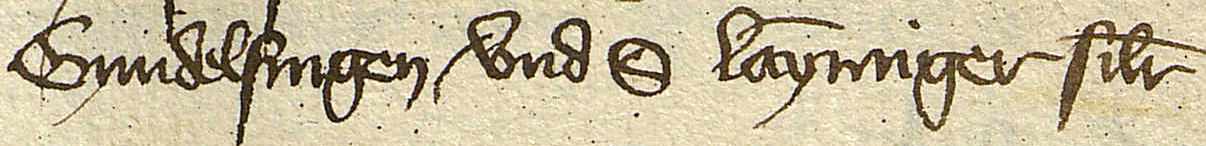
Gundelfingen / vnd S lay*ninger ſilr*
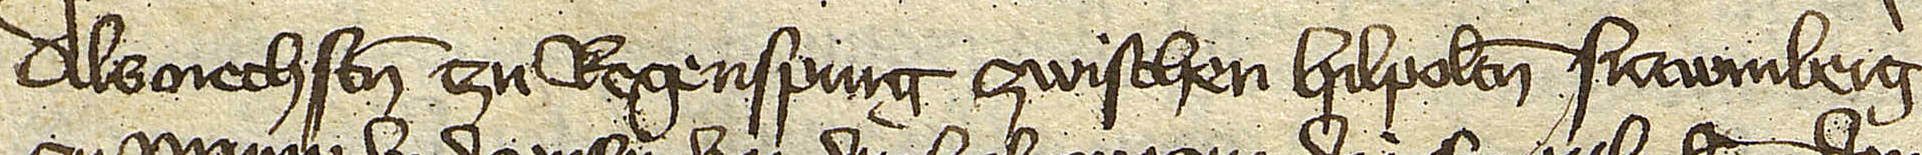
Als nechſtn* cʒu Regenſpurg cʒwiſchen hilpoltn* frawmberg
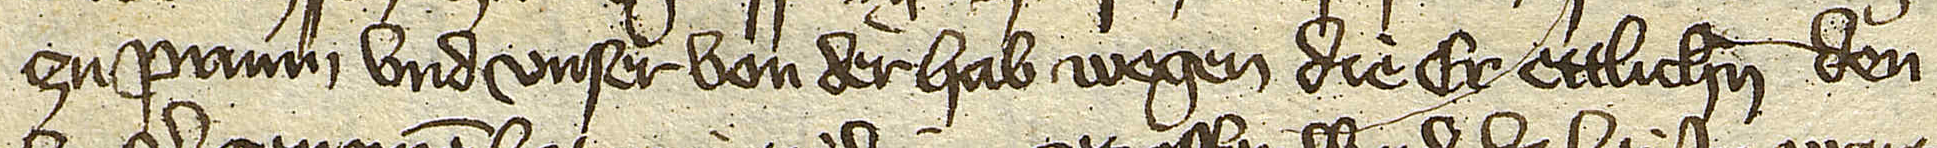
cʒu Prunn / vnd vnſer von der hab wegen die Er ettlichn* den
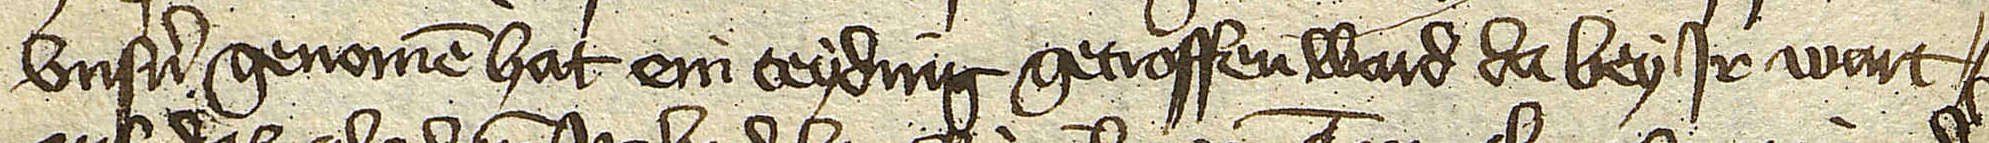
vnſn* genome* hat ein teyding getroffen ward da bey Ir wart /
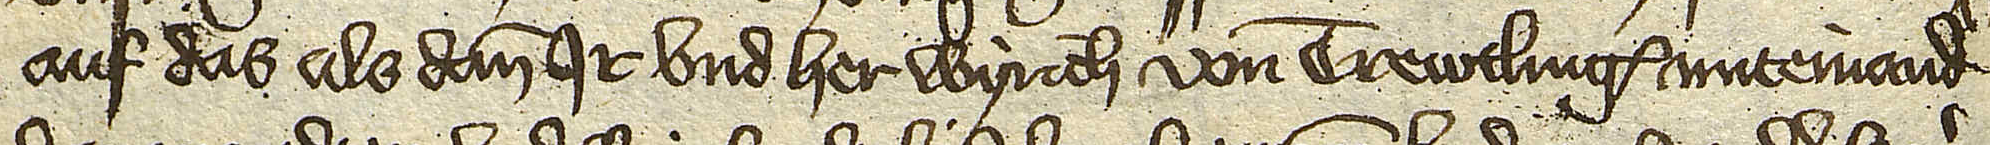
auf das als dan* Ir vnd her wyrich von Trewtling* miteinand*
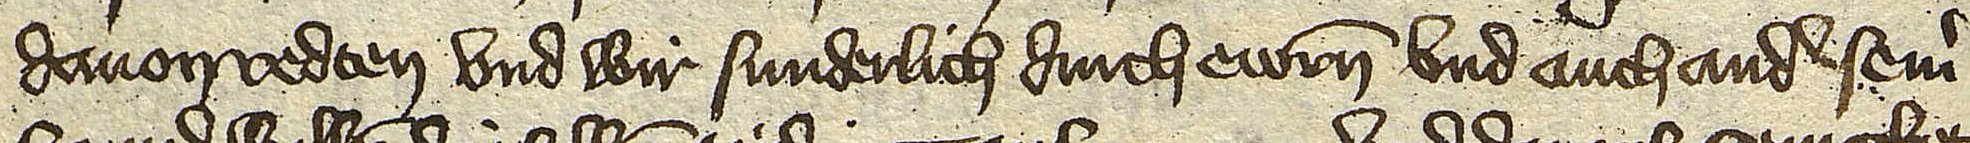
dauon redten vnd wir ſunderlich durch ewrn* vnd auch and* ſein
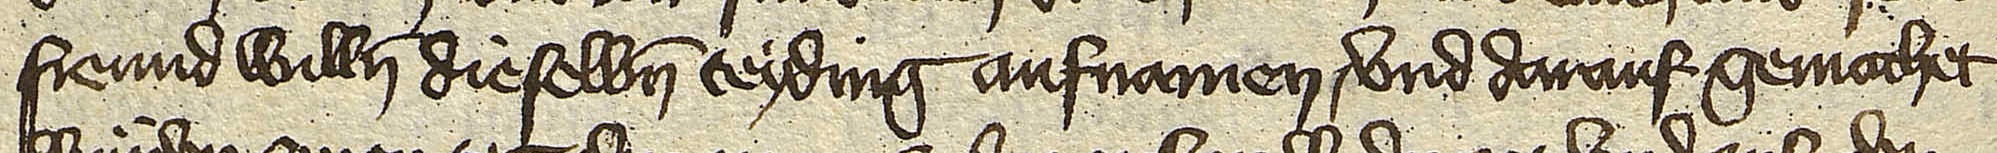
freund wilh* dieſelbn* teyding aufnamen / vnd darauf gemachet
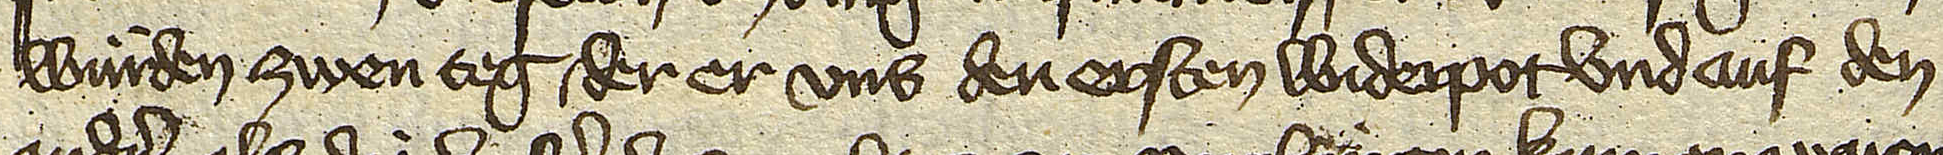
würden cʒwen teg / der er vns den erſten widerpot vnd auf den
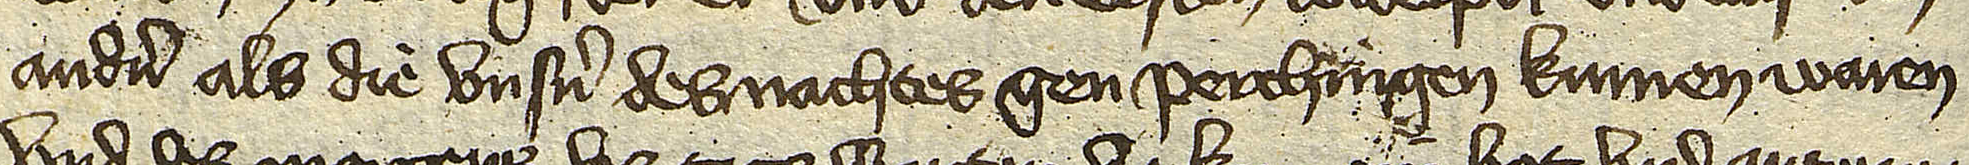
andn* als die vnſn* desnachtes gen perchingen kumen waren
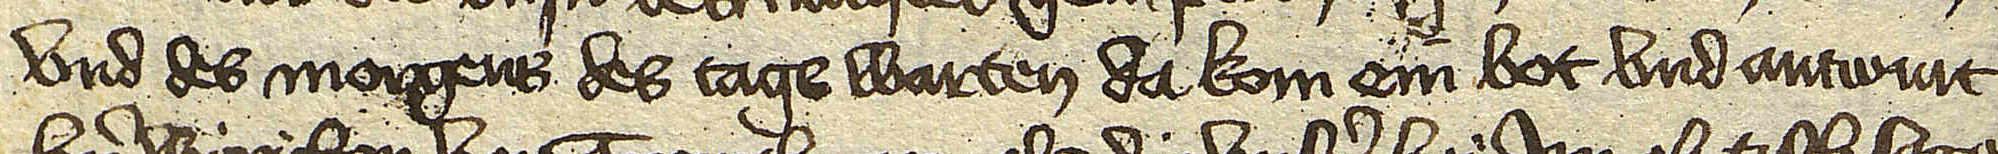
vnd des morgens des tags warten da kom ein bot vnd antwurt
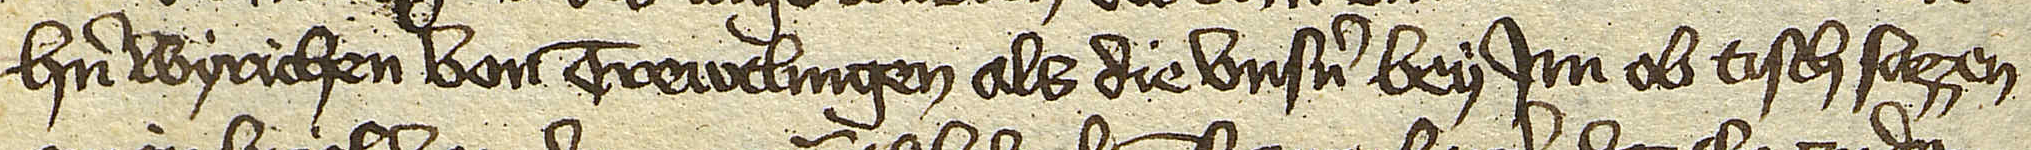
hn* wyrichen von Trewtlingen als die vnſn* bey Im ob tiſch ſaʒʒen
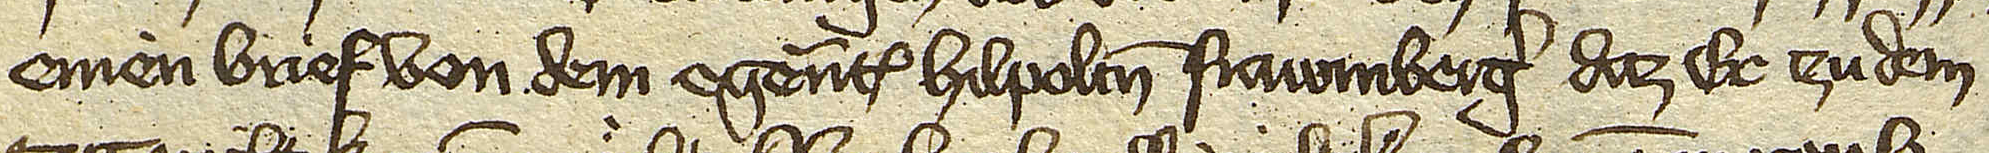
einen brief von dem egen*t* hilpoltn* frawmberg* daʒ Er cʒu dem
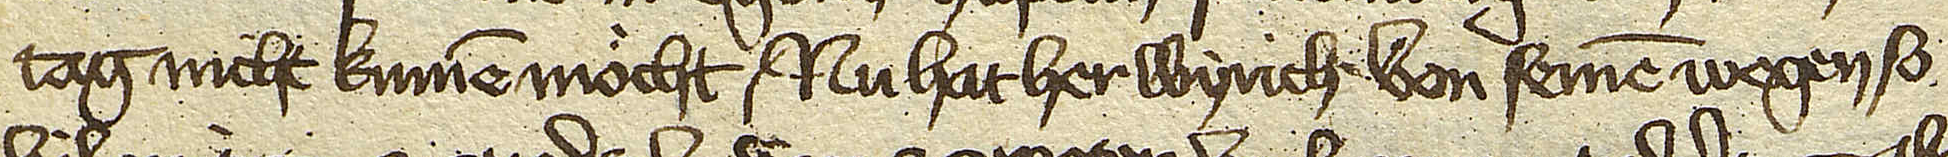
tag nicht kume* möht / Nu hat her wyrich von ſeine* wegen ſo
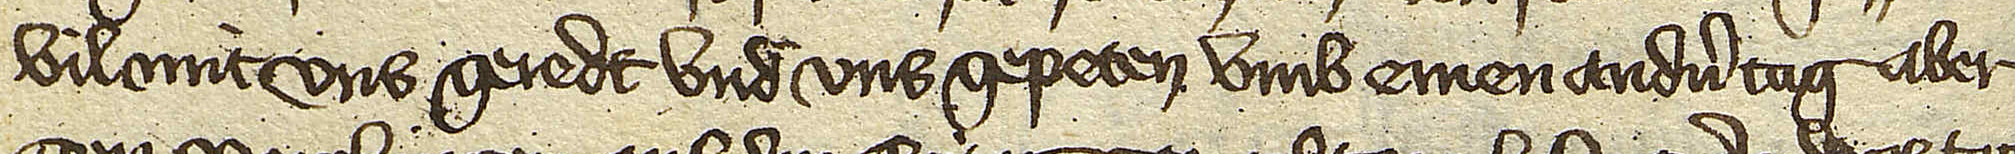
vil mit vns geredt vnd vns gepeten vmb einen andn* tag aber
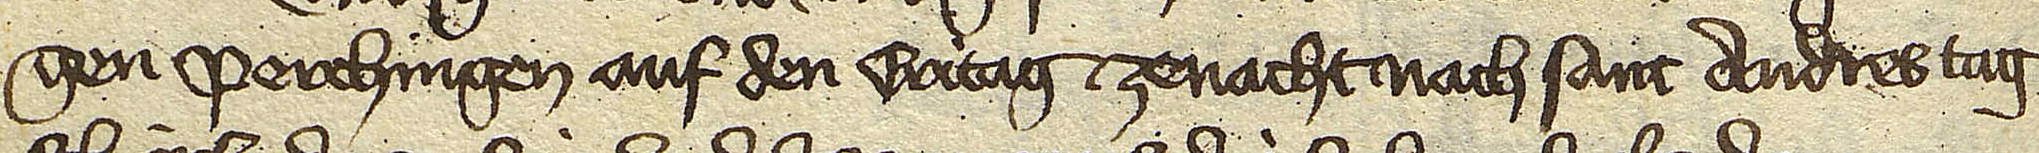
gen Perchingen auf den Eritag cʒenacht nach ſant Andres tag
